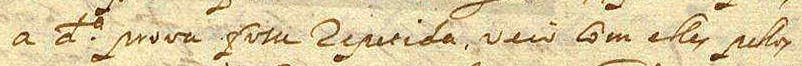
a d̄.a prova fosse Repetida, veio com elles pellos
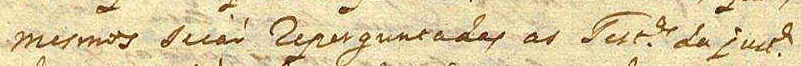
mesmos seiaõ Reperguntadas as Test.as da just.a
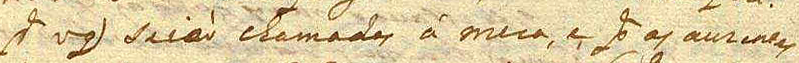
pa o q̄ seiaõ chamadas á meza, e pa as auzentes
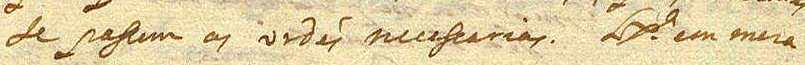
se passem as ordes̄ necessarias. Lx.a em meza
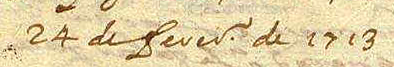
24 de fever.o de 1713
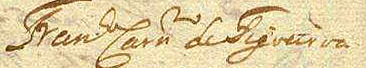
Fran.co Carn.ro de Figueiroa
